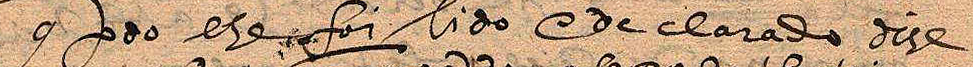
q̄ todo lhe foi lido e declarado dise
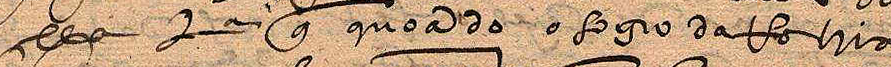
ella ta q̄ quoādo o sogro da Re hia
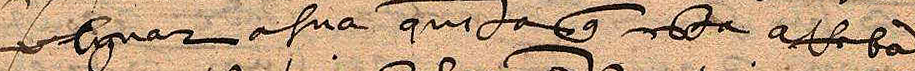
folguar a sua q̄uita q̄ esta a Rebā
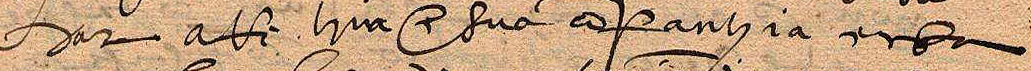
dar a Re hia ē sua c̄opanhia e esta
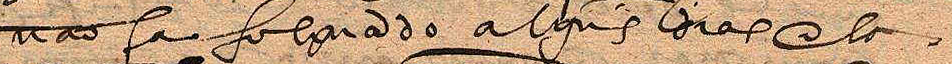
uão la folguādo algūs dias e la
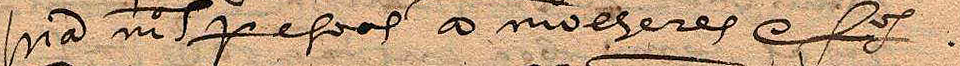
hiā mtas pesoas c̄o molheres e fos
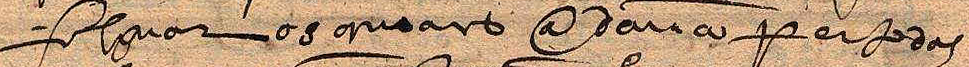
folguar os quoaes ādauão per todas
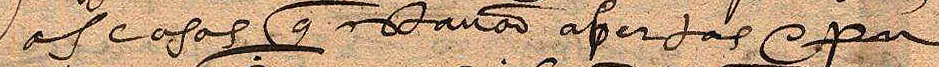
as casas q̄ estauão abertas e pu
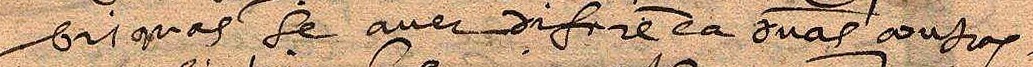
briquas s̄e auer diferēca dūas a outras
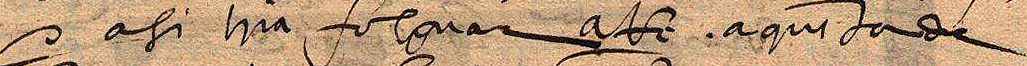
e asi hia folguar a Re . a quīta de
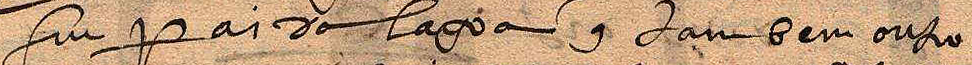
seu pai da lagoa q̄ tambem outro
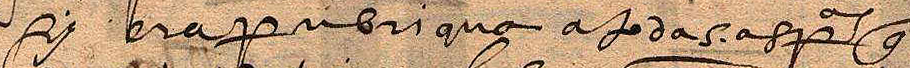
sy era pubriqua a todas as pas q̄
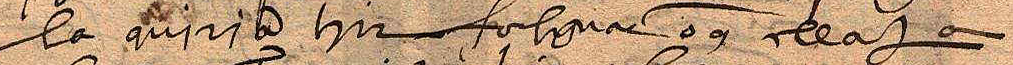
la qujrjā hir folguar o q̄ ella ta
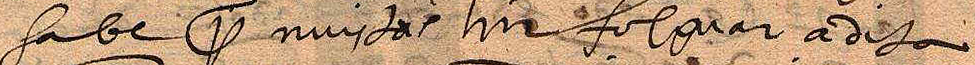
sabe p̄o mujtas hir folguar a dita
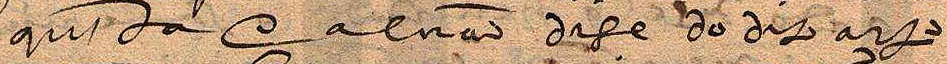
quīta e al não dise do dito arto
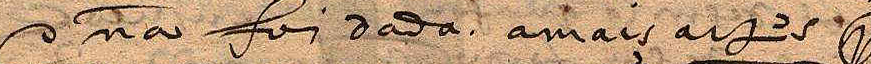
e não foi dada . a mais artos p̄o
